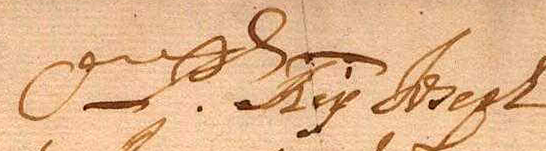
O P.e Frey Ioseph
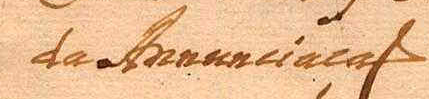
da Annunciaçaõ
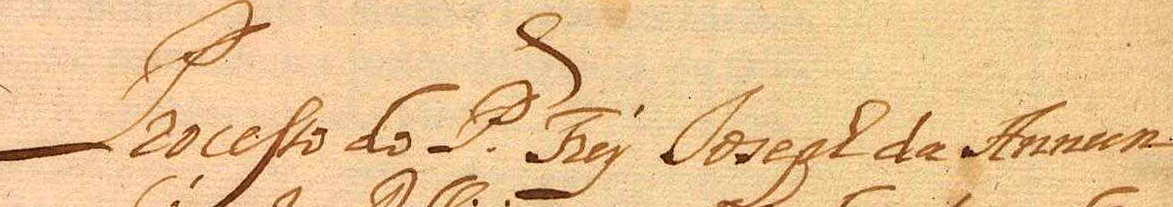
Processo do P.e Frey Ioseph da Annun
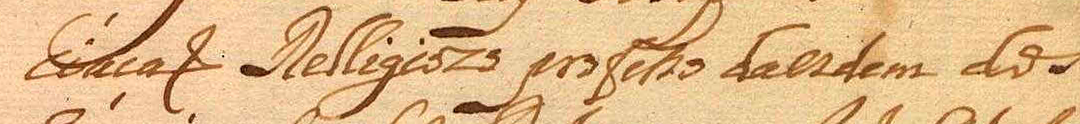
ciaçaõ Relligiozo professo da ordem dos
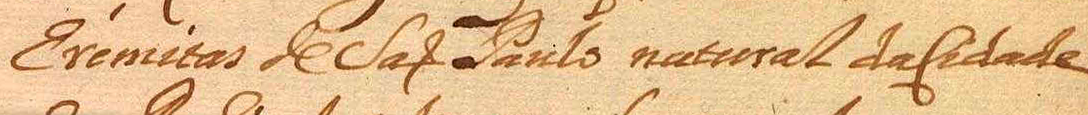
Eremitas de Saõ Paulo natural da Cidade
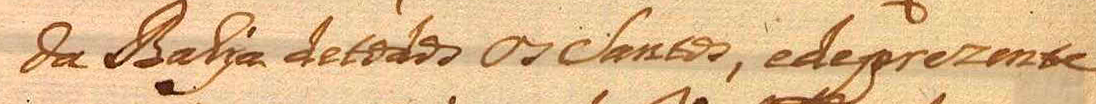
da Bahya de todos os Santos, e de prezente
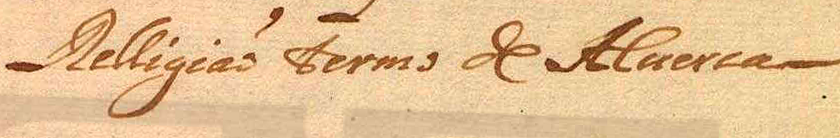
Relligiaõ termo de Aluerca
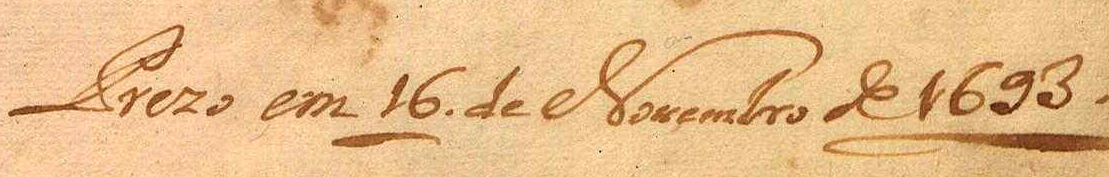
Prezo em 16. de Nouembro de 1693.
